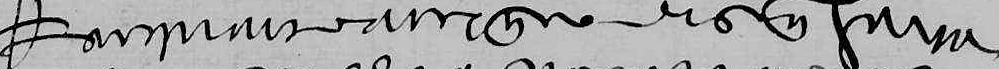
item ao quarto artyguo dise q̄ ha vja
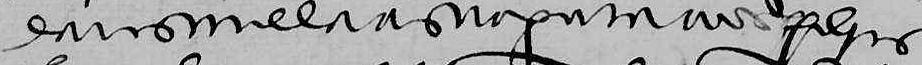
dar esmolla a sua porta aos pobres
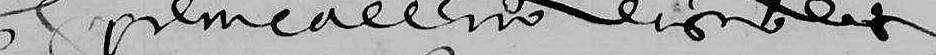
q̄ ha pedem e all n̄o dise dos
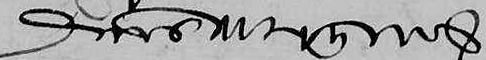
ditos artyguos
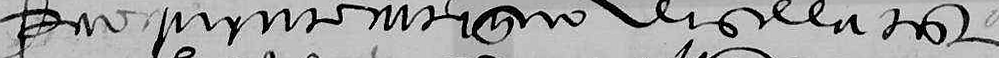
item ao quynto artyguo dis ella testa
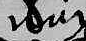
may
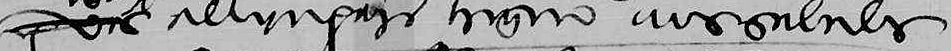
p̄vas allynparē triguo aos sabados
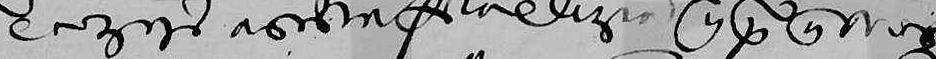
e cozerē a sesta fra e diziā q̄ p̄oq̄ aos
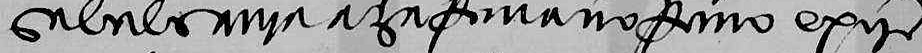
sabados auja azafama no forno e porē
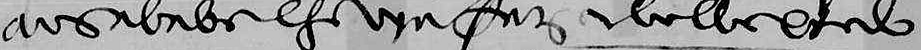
aos sabados lhe vya fazer bollos e todo
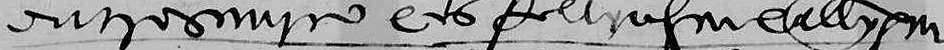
outro serujço e esfelvynhar e allȳpar
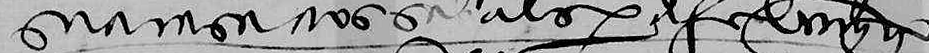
sua casa aos sabados ꝑa ho domȳgo
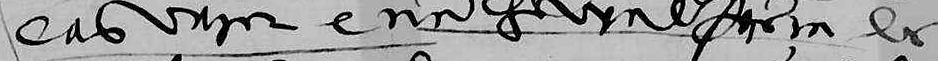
e as varer e nā lhe vya deferēça dos
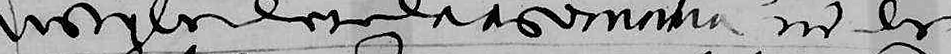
vestydos de toda a somana nē dos
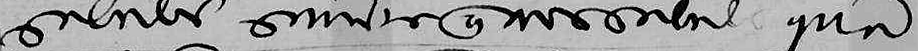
sabados somēte q̄ aos sabados quā
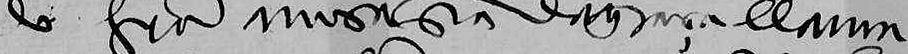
do hyā a nosa s̄ra da graça llança
